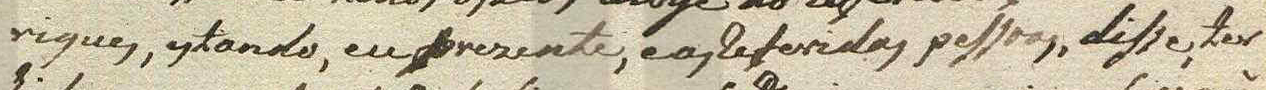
riques, estando, eu prezente, e as Referidas pessoas, disse, ter
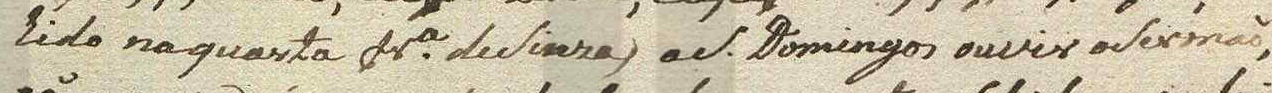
hido na quarta fr.a de Sinzas a S. Domingos ouvir o sermaõ,
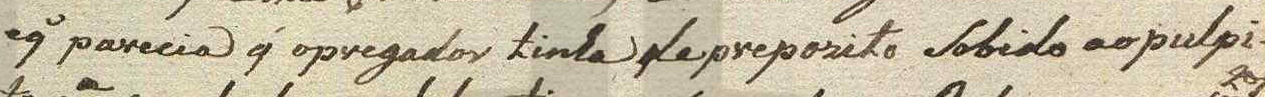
e q̄ parecia q̄ o pregador tinha de prepozito sobido ao pulpi
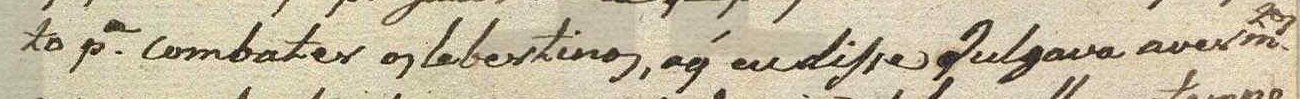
to p.a combater os lebertinos, o q̄ eu disse Julgava aver m.tos
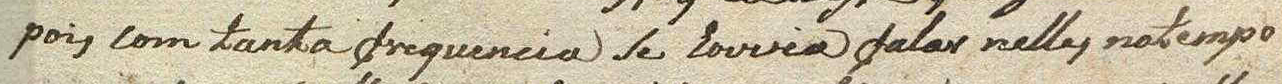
pois com tanta frequencia se houvia falar nelles no tempo
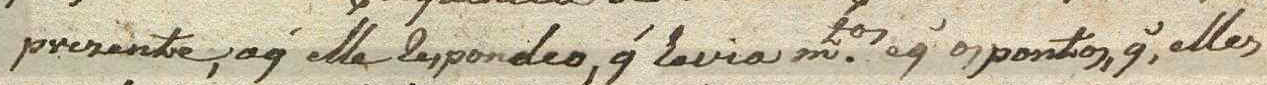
prezente, a q̄ elle Respondeo, q̄ havia m.tos e q̄ os pontos, q̄ elles
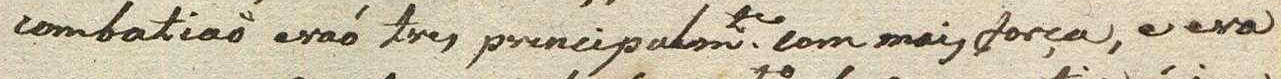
combatiaõ eraõ tres principalm.te com mais força, e era
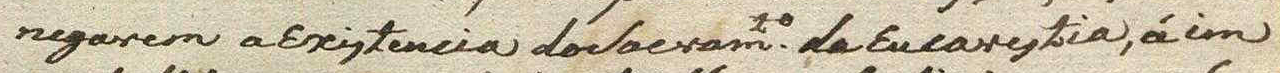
negarem a Existencia do sacram.to da Eucarestia, á im
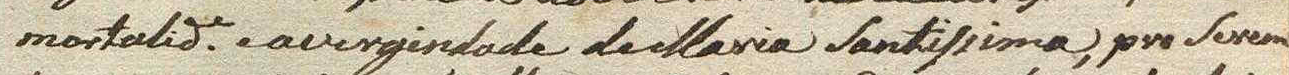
mortalid.e e a vergindade de Maria Santissima, pro serem
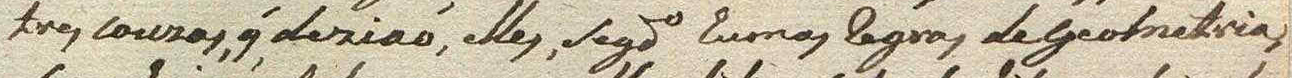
tres couzas, q̄ deziaõ, elles, segd.o humas Regras de Geometria,
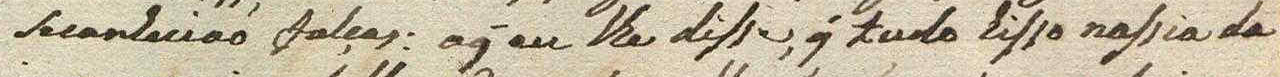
se conheciaõ falças: o q̄ eu lhe disse, q̄ tudo hisso nassia da
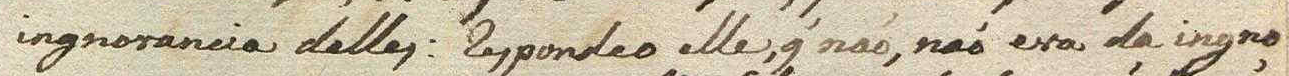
ingnorancia delles: Respondeo elle, q̄ naõ, naõ era da ingno
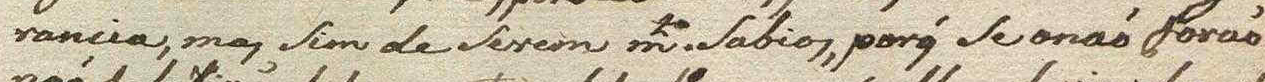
rancia, mas sim de serem m.to sabios, porq̄ se o naõ foraõ
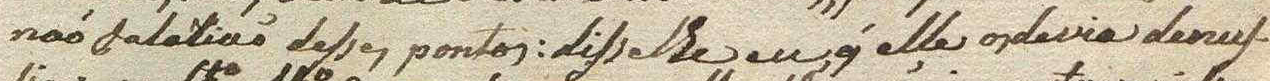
naõ falariaõ desses pontos: disselhe eu, q̄ elle os devia denus
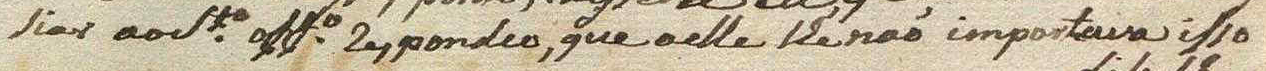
siar ao S.to offf.o Respondeo, que a elle lhe naõ importava isso
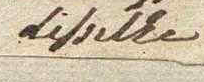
disselhe
